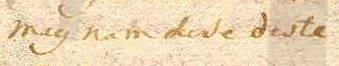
maes nam dise deste
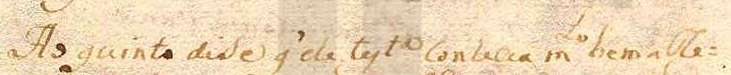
Ao quinto dise q̄ ele testa conhecia m.to bem á The
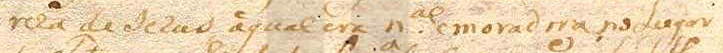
reza de Iezus á qual era n.al e moradora no Lugar
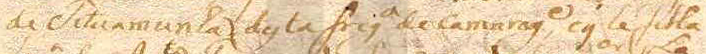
de Fetuamunha desta freg.a de camarag.e e q̄ he filha
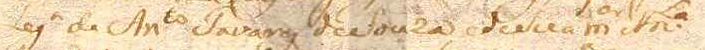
Leg.a de Anto Tavares de souza, e de sua m.er An.ta
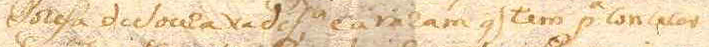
Iozefa de Souza xa def.a e a razam q̄ tem pa conhecer
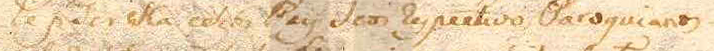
he p̄ ser ella e seos Pais seos Respectivos Paroquianos
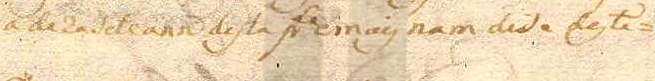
a dezasete ann̄ desta p.te e mais nam dise deste
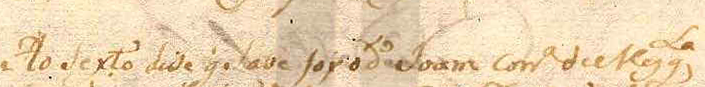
Ao sexto dise q̄ save foy o do Ioam corra de Mesq.ta,
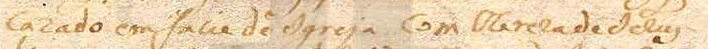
cazado em facie da Igreja Com Thereza de Iezus
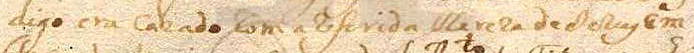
digo era cazado com a Referida Thereza de Iezus em
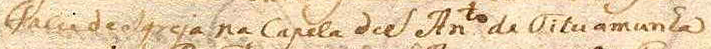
facie de Igreja na Capela de S. An.to da Tituamunha
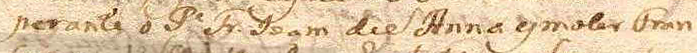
perante o P.e Fr Ioam de S Anna esmoler Fran
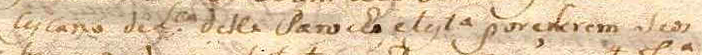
ciscano de L.ca delle Parocho, e test.a poreserem seos
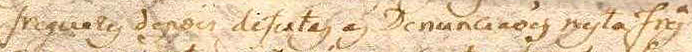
freguezes depois de feitas as Denunciaoẽs nesta frg.a
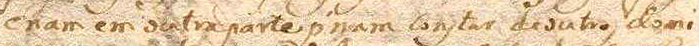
e nam em outra parte p̄ nam constar de outro, domi
